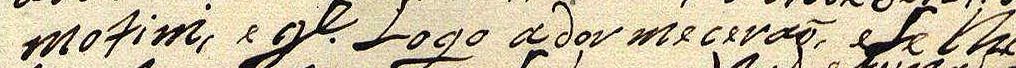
motim; e q̄ Logo adormeceraõ, e se lhe
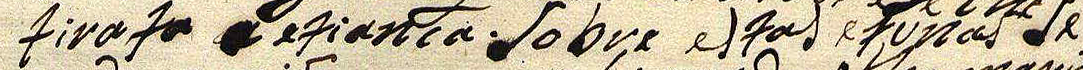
tirato a e tiança. sobre estas e tunas se
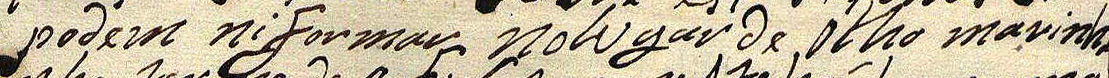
podem niformar no lugar de olho marinh
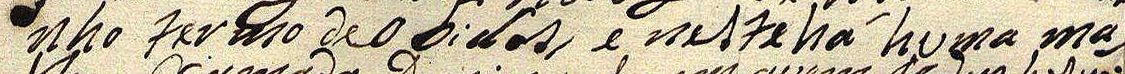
nho termo de obidos, e neste há huma ma
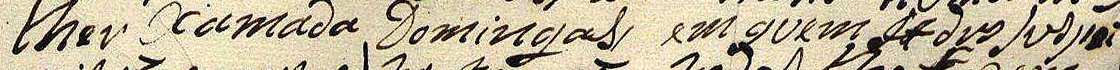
lher xamada Domingas em quem todus suspei
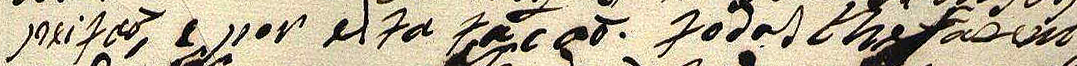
peitaõ, e por esta taçaõ. todas lhe fazem
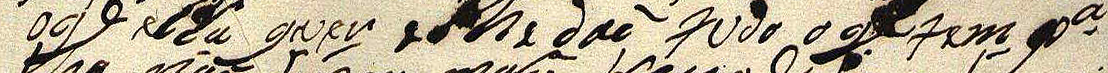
o q̄ elha quer e lhe daõ tudo o q̄ tem p.a
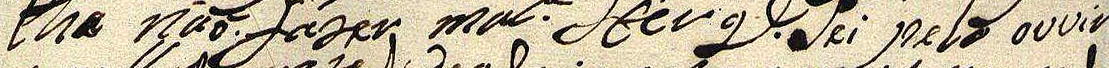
lha naõ. fazer mal. Her q̄. sei pelo ouuir
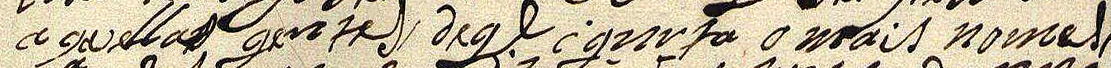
aquellas gente de q̄. ignrta o mais nomes,
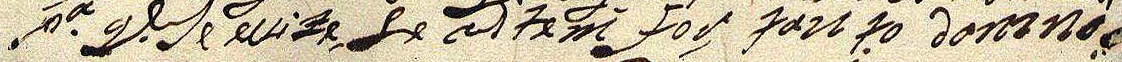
p.a q̄. se euite se astem for, tanto damno
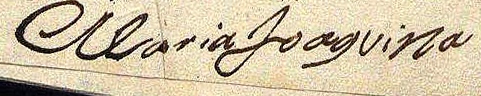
Maria Joaquina
